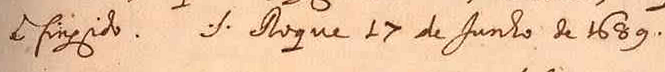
e fingido. S. Roque 17 de Junho de 1689.
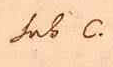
sub C.
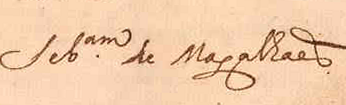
Seb.am de Magalhaẽs
